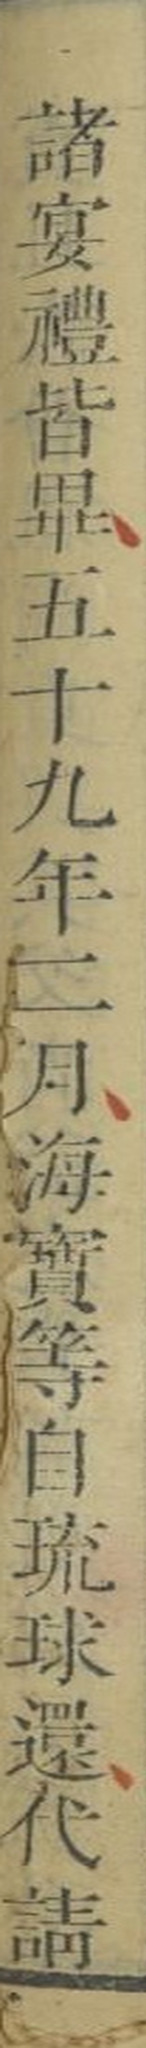諸宴礼皆畢五十九年二月海宝等自琉球還代請
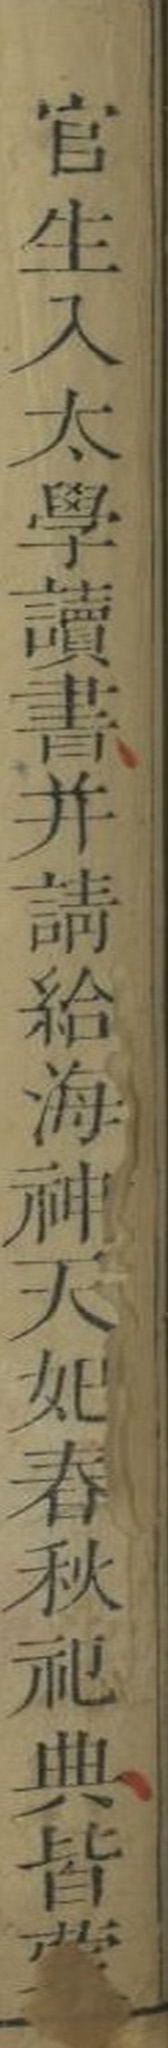官生入太学読書并請給海神天妃春秋祀典皆蒙
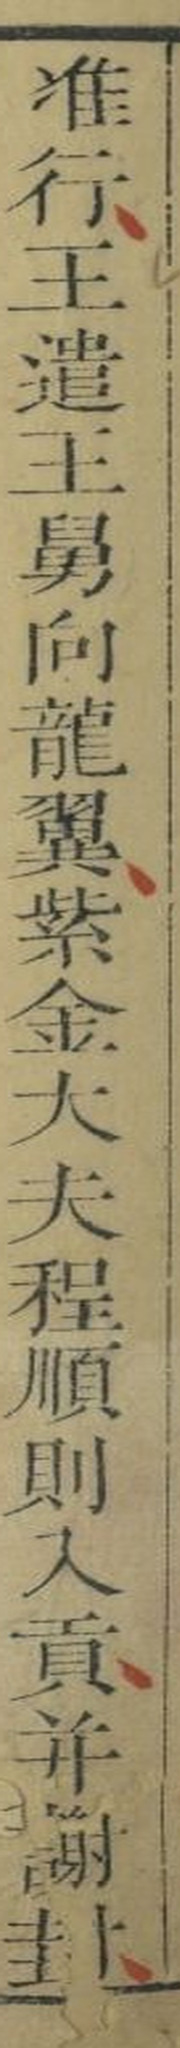准行王遣王舅向竜翼紫金大夫程順則入貢并謝封
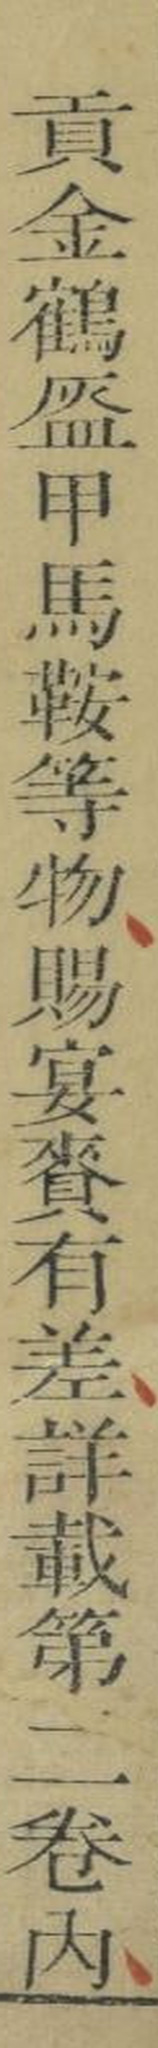貢金鶴盔甲馬鞍等物賜宴賚有差詳載第二巻内
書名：中山伝信録 巻三
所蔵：University of the Ryukyus Library
